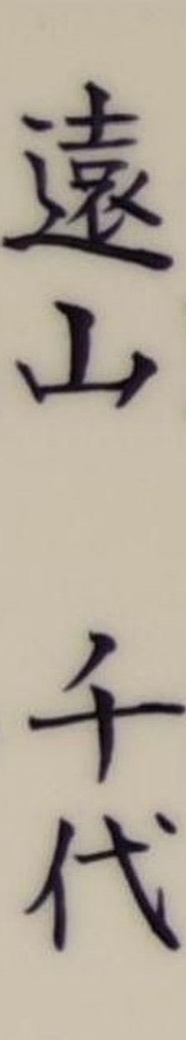遠山千代
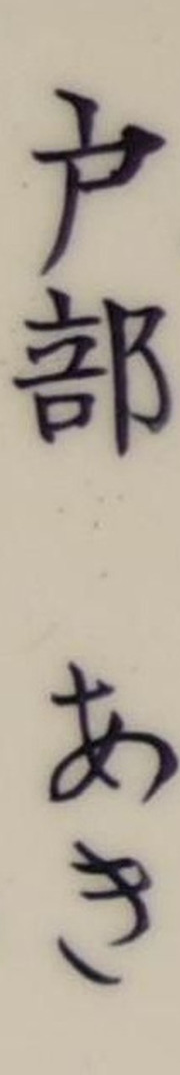戸部あき
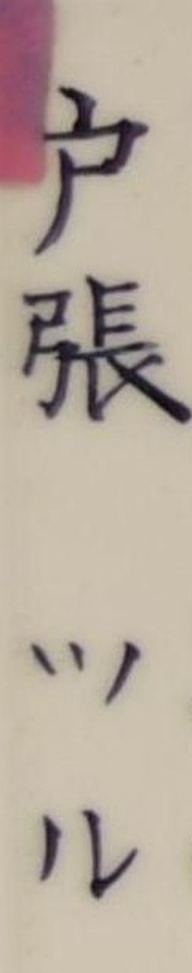戸張ツル

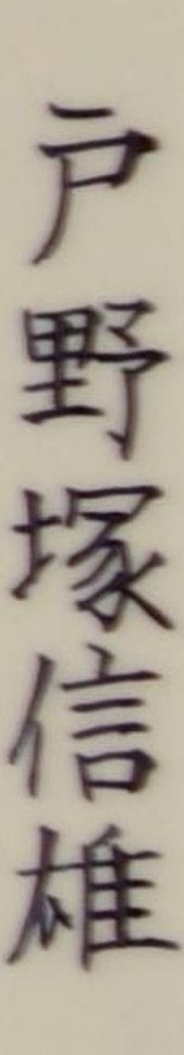戸野塚信雄
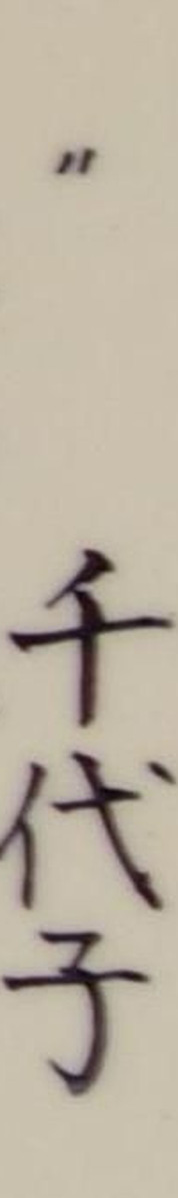千代子
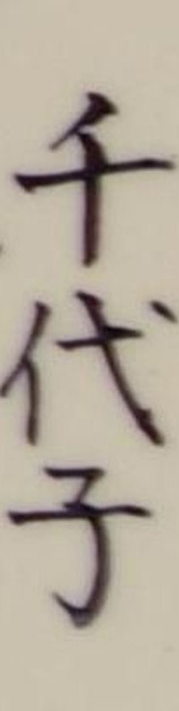千代子
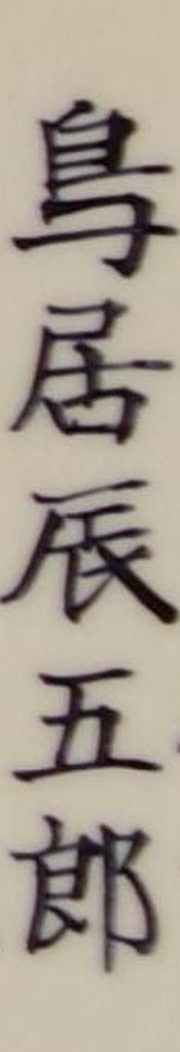鳥居辰五郎
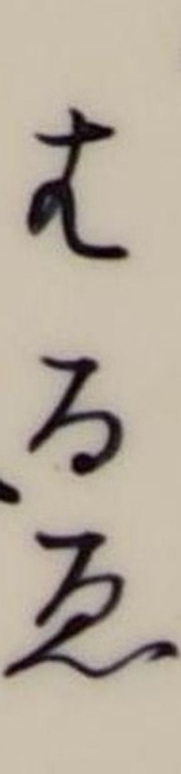はるえ
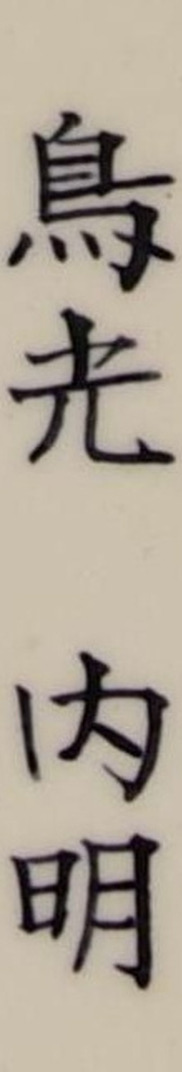鳥光内明
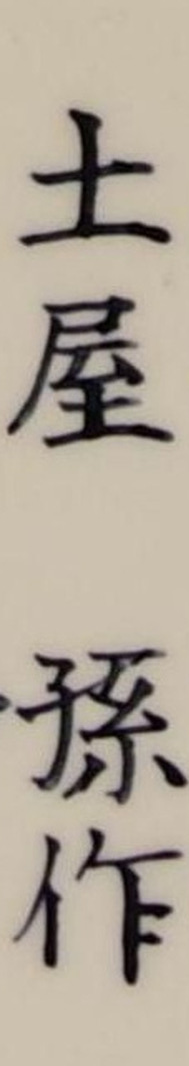土屋孫作
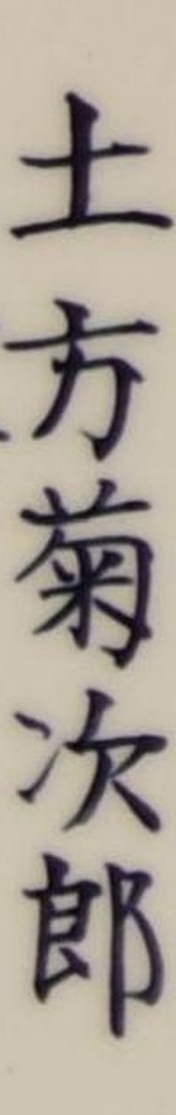土方菊次郎
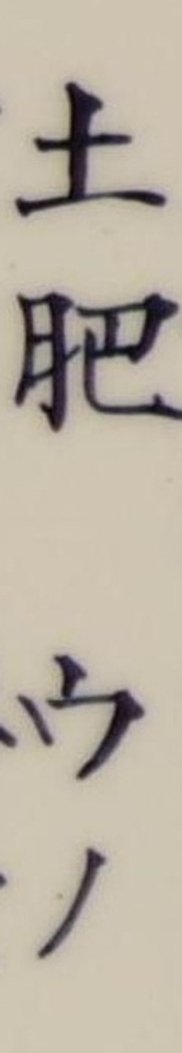土肥ウノ
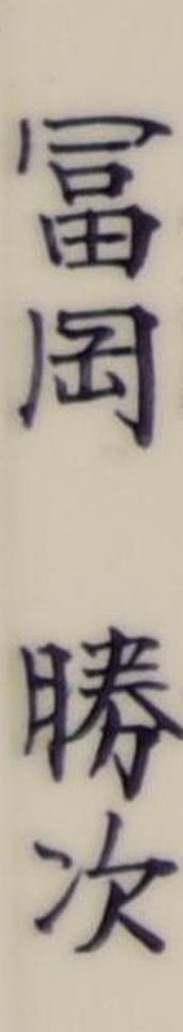冨岡勝次

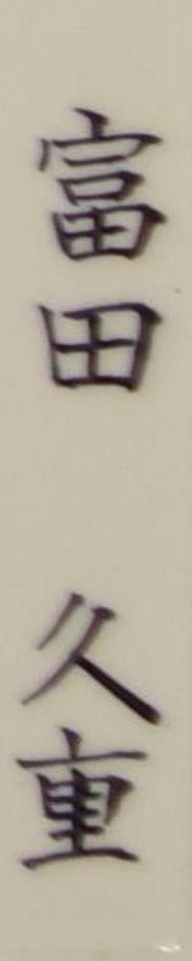富田久重
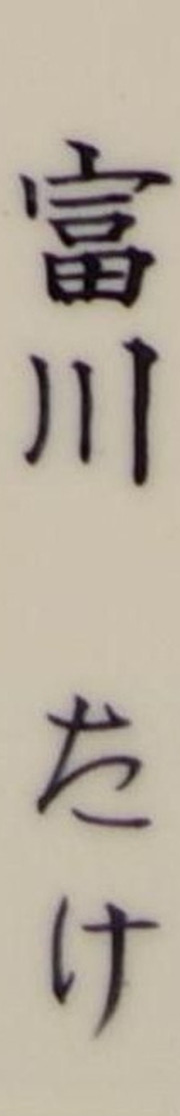富川たけ
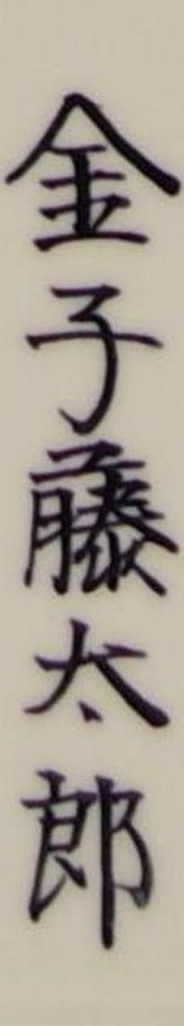金子藤太郎
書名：E~L
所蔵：高野山金剛峯寺
